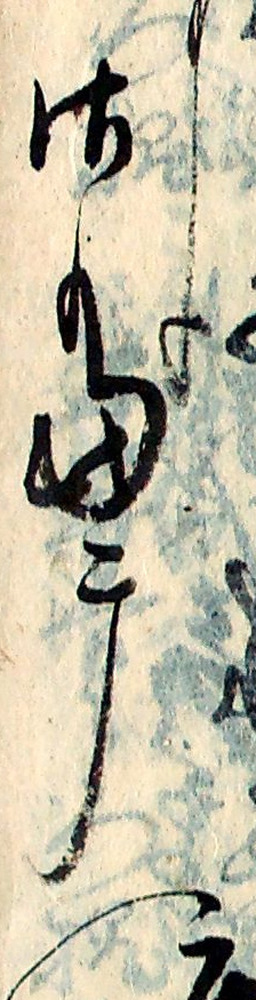御当て

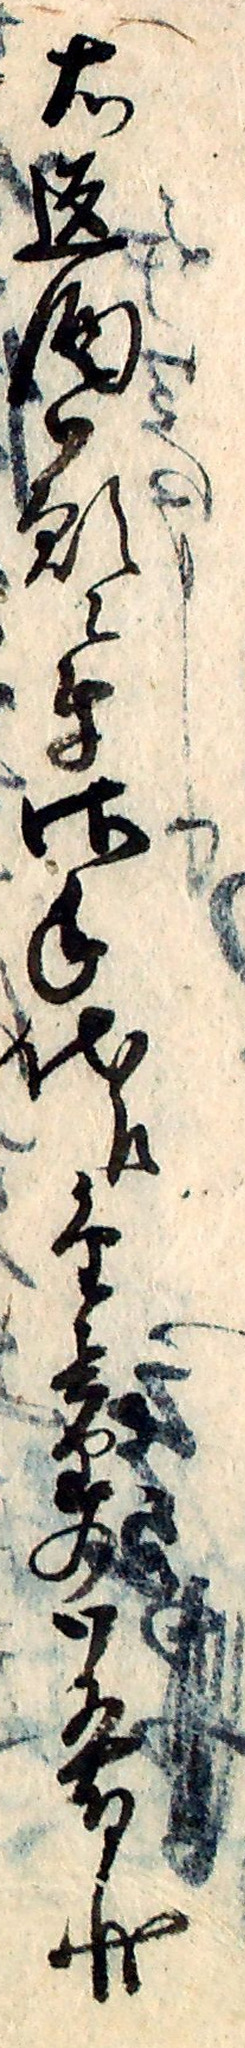右造酒御願に付御手代え金壱歩御肴共
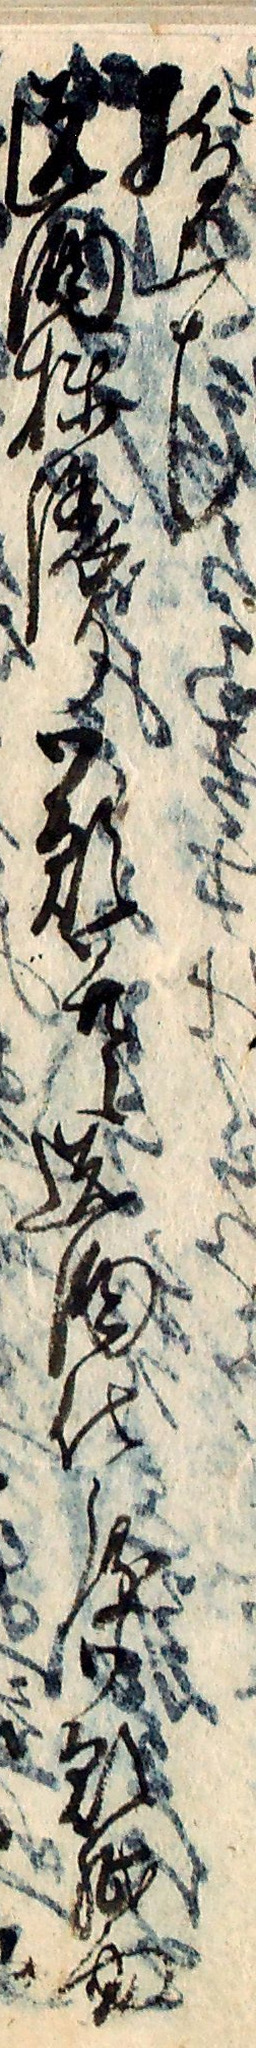造酒株譲り御願并に造酒仕度御願紙面
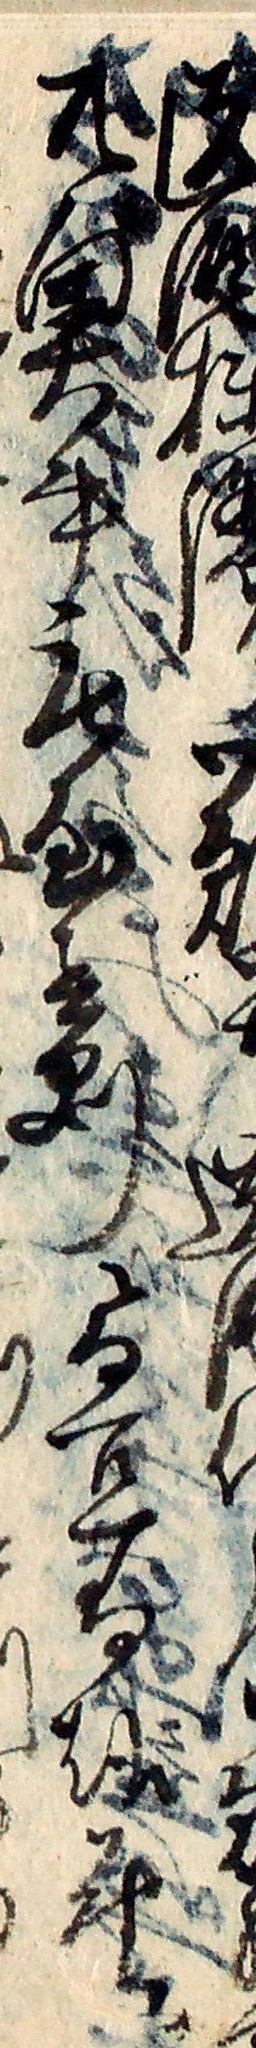共奥書庄屋壱判にて宜布趣御座候

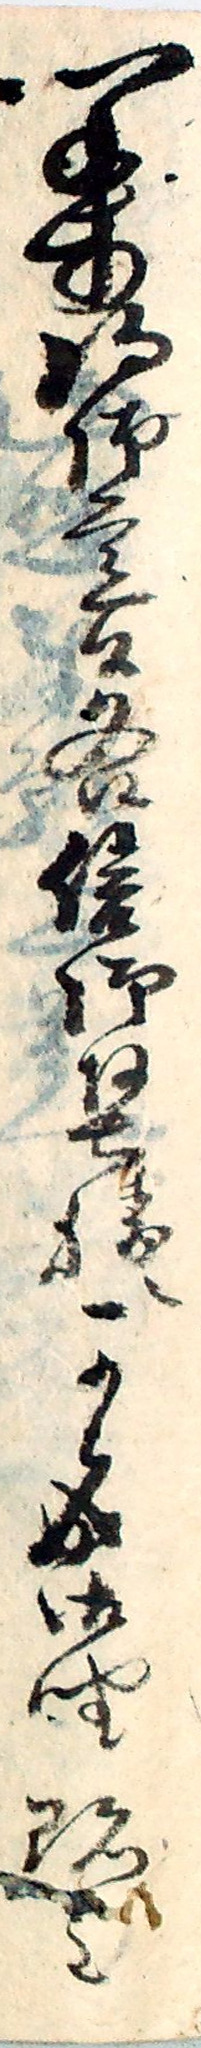以手紙得御意候各様御堅勝に可被成御座珍重
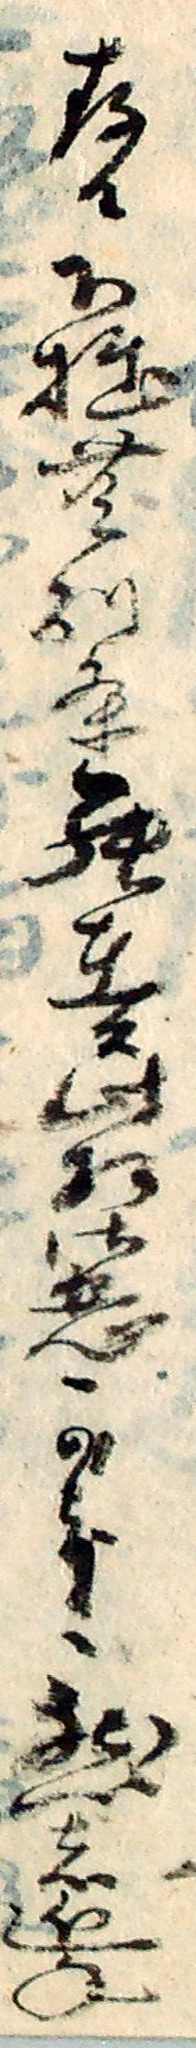存候下拙無別条罷在候此段御安心可被下候然は近年
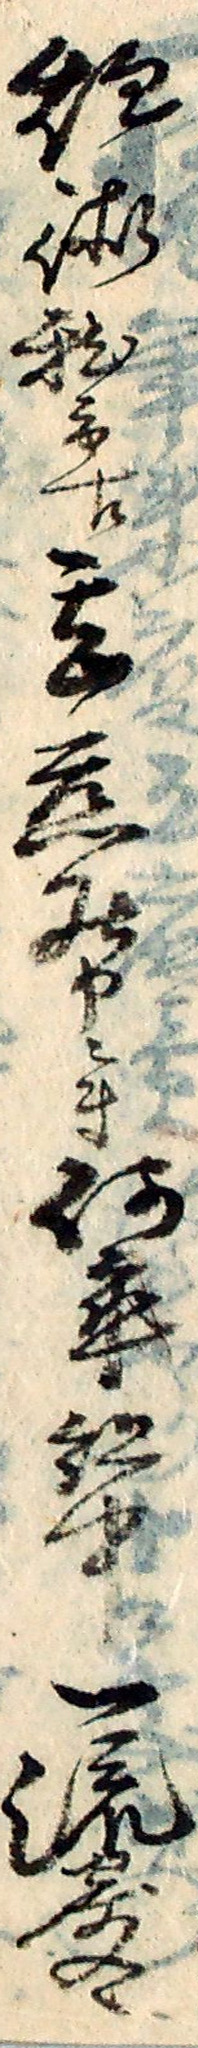炮術稽古甚怠居申に付何卒組中一流寄合
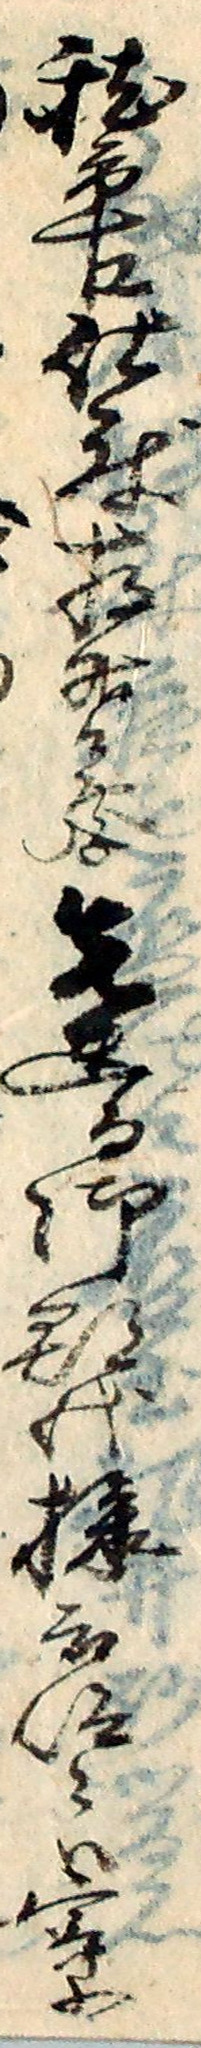稽古仕度存居候処先達て御郡代様被仰候は最早
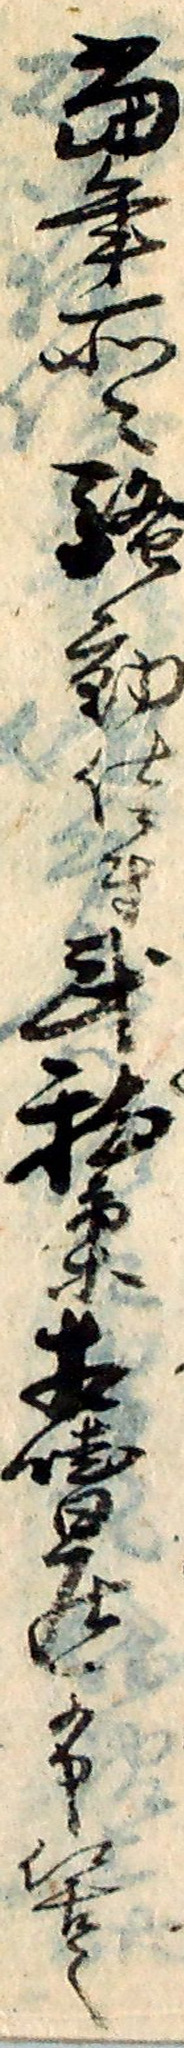当年所々騒動仕に付武稽等相嗜居可申筈候
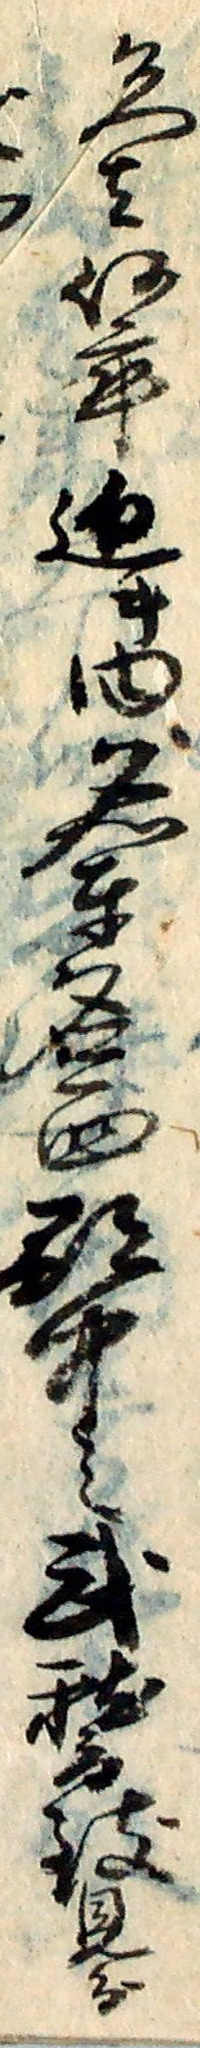えは何卒近き内名東名西郡中之武稽致見分
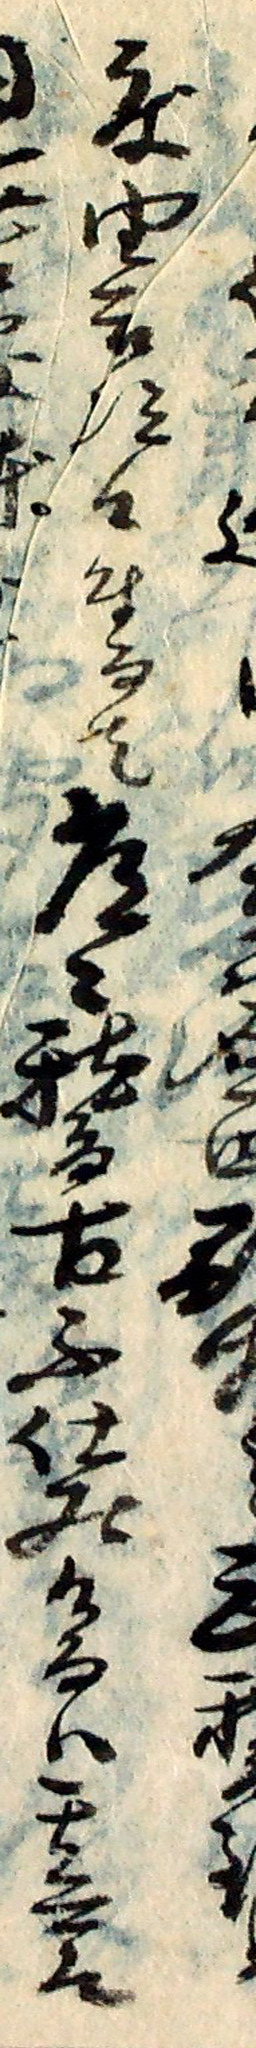度由被仰候付ては常々稽古不仕居候ては其節
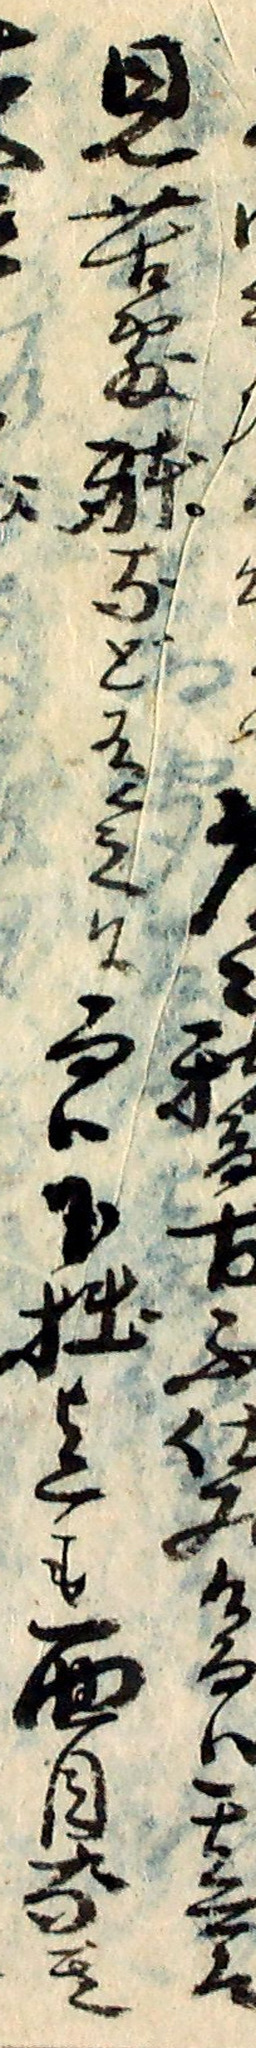見苦敷躰など有之候ては下拙迄も面目なき
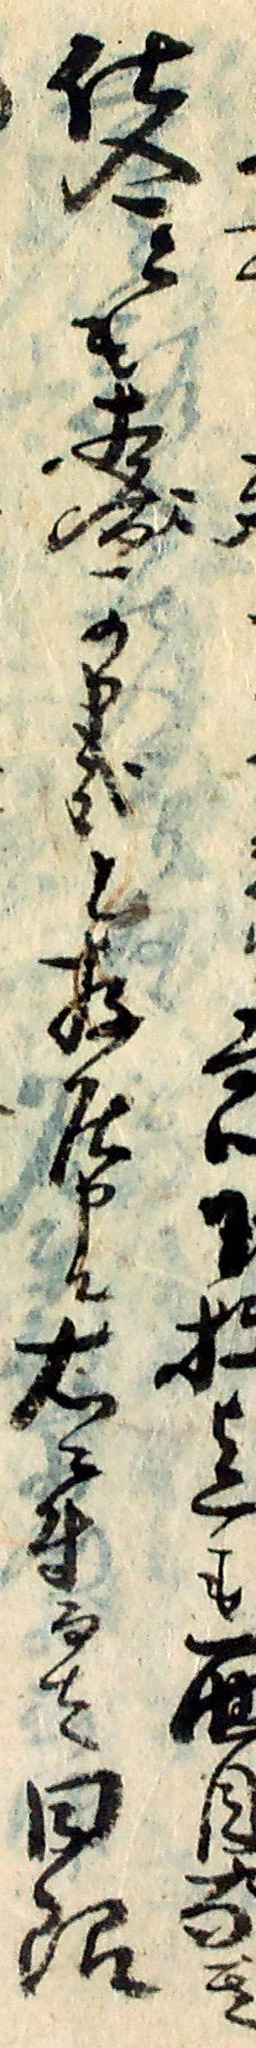仕合とも相成可申哉と存居申候右に付ては日限
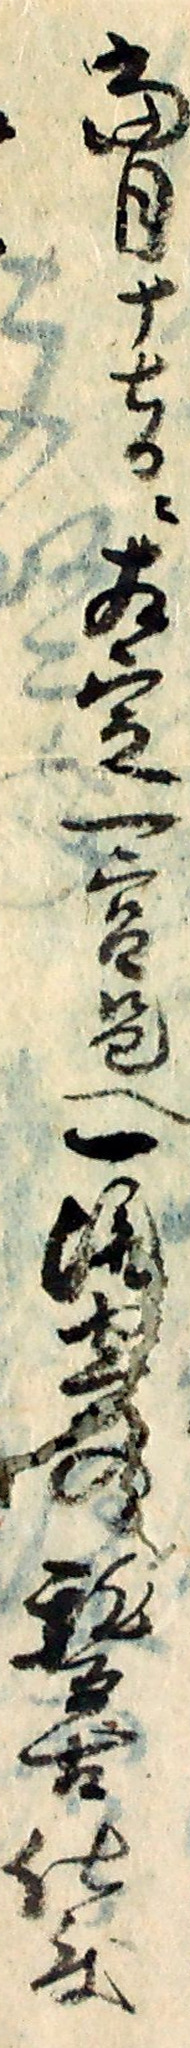当月十七日に相定一宮邑へ一流寄合稽古仕度
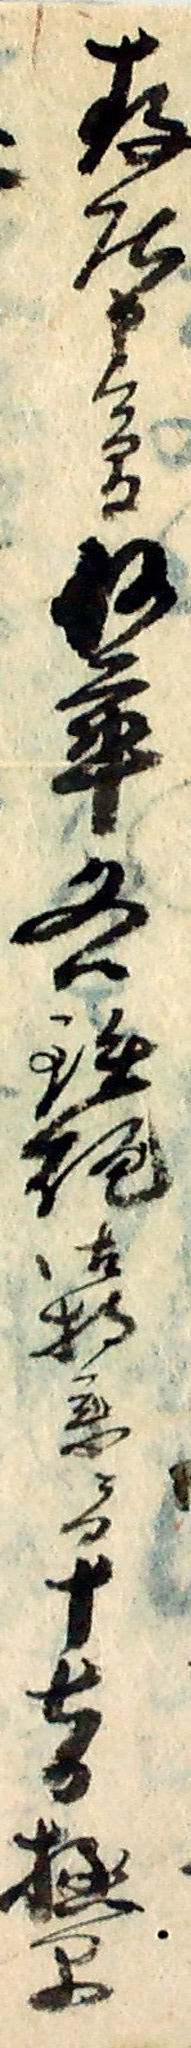存居申候間何卒各鉄炮御持参にて十七日極早
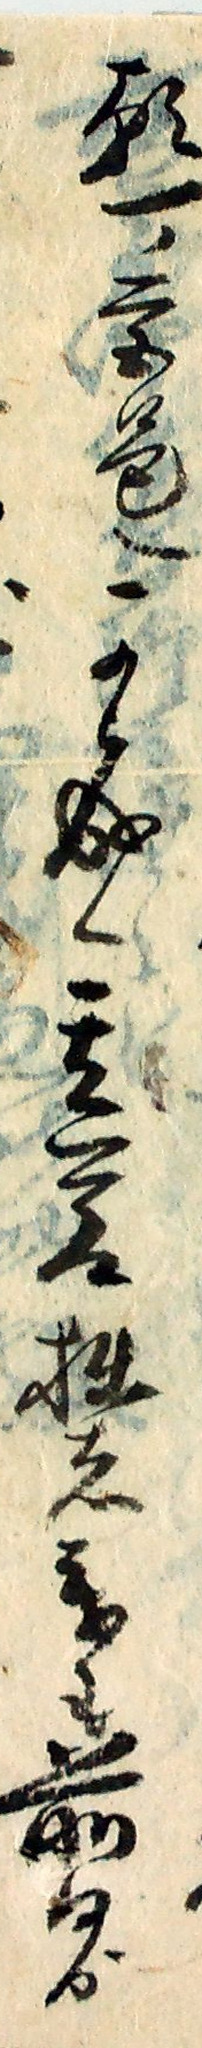朝一ノ宮邑へ可被成候其節拙者義も前日ゟ
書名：諸御願書控(後藤氏壱番）
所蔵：鳴門教育大学 Naruto University of Education
